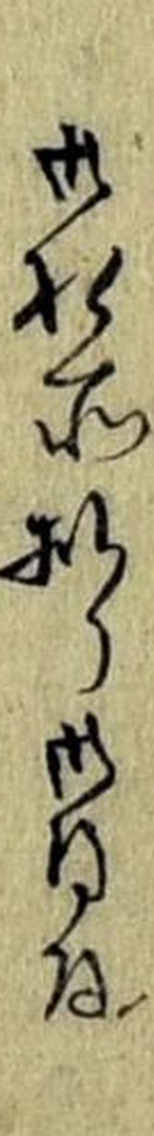御札所掛り御目付
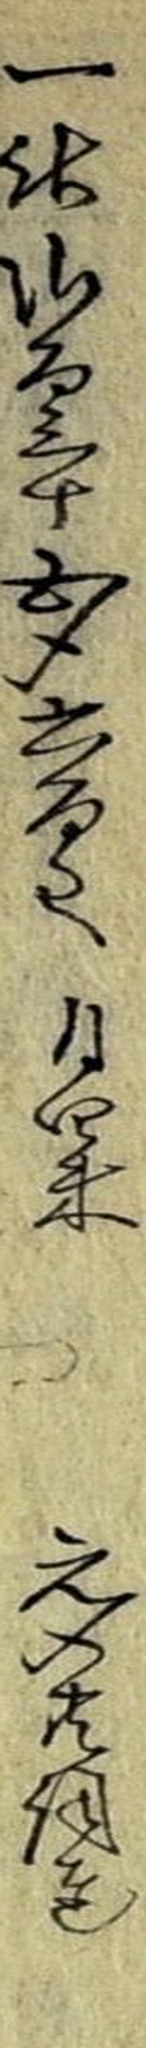一銀弐百三十五貫六百匁月四朱元〆共調達
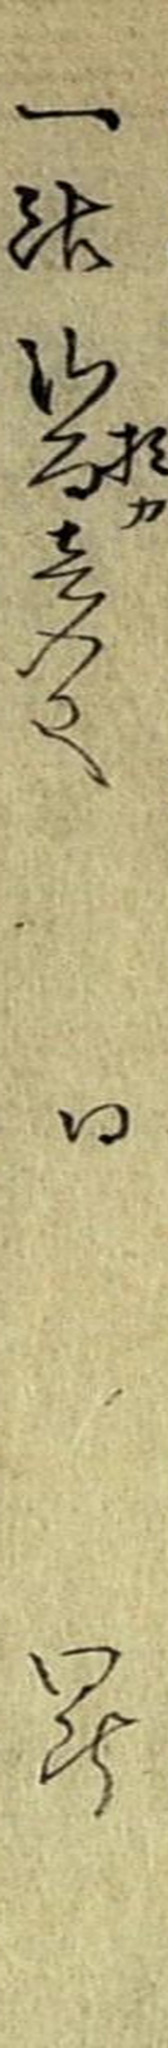一銀弐百壱貫匁同同断
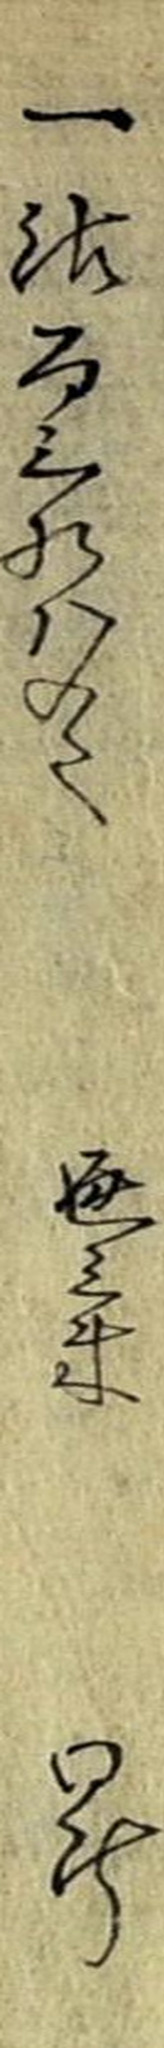一銀百三拾八貫匁通三朱同断
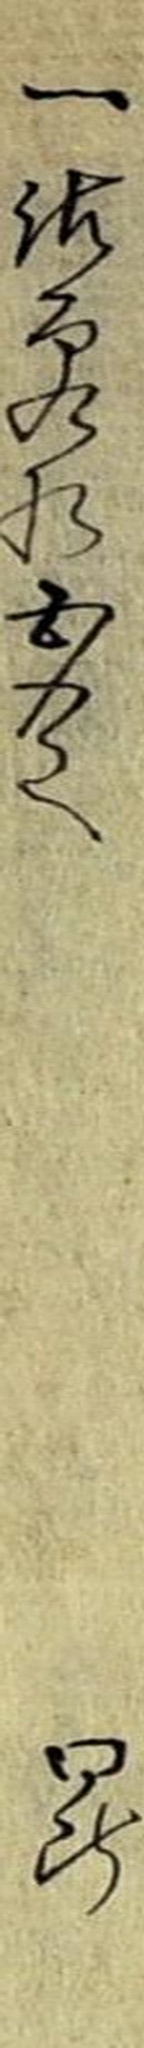一銀百九拾五貫匁同断
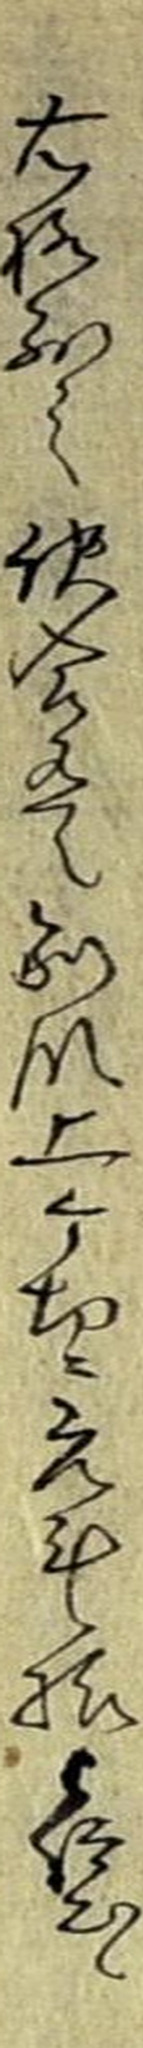右各別之訳合有之別段上ヶ切に取斗候様被仰出候
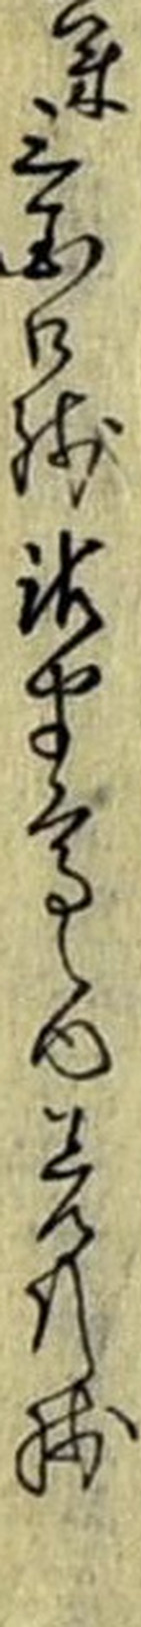三国口銭銀半高之内差引残
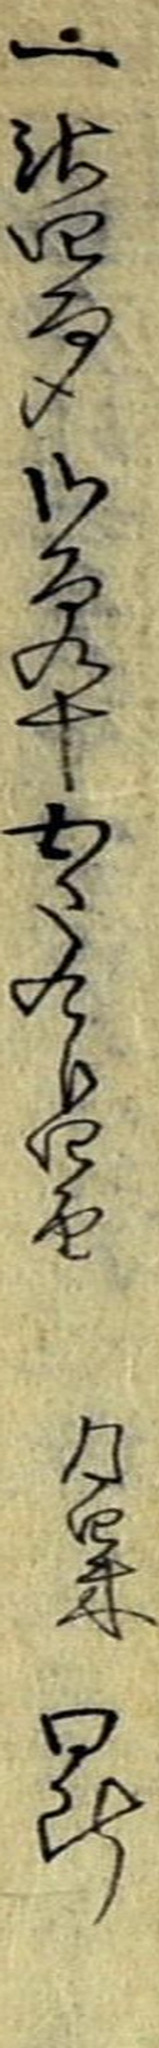一銀四百貫弐百九拾五匁九分四厘月四朱月四朱同断

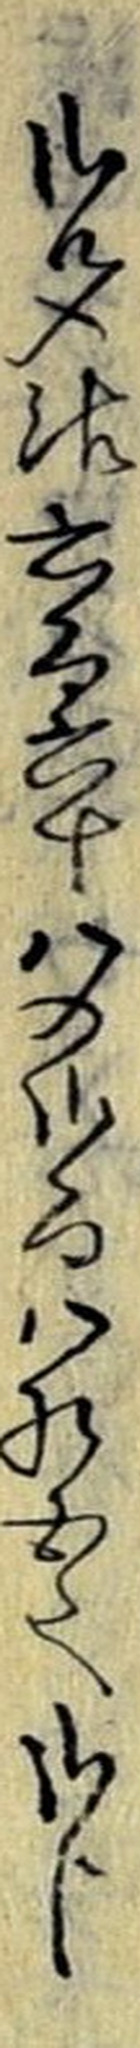弐口〆銀六百六十八貫弐百八拾五匁弐分
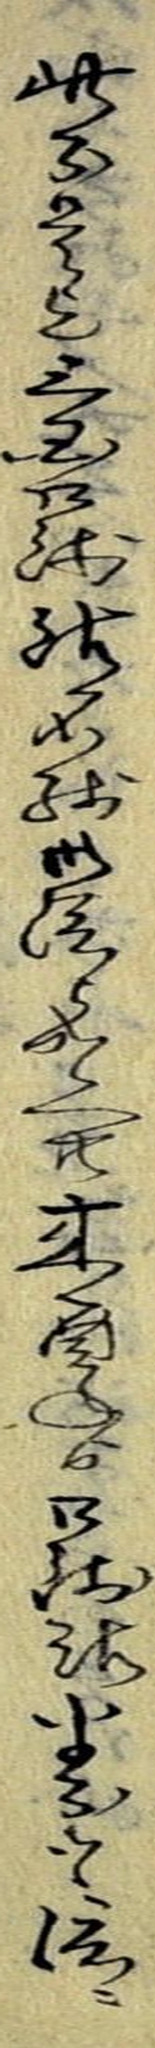此分是迄三国口銭銀不残御渡被成候へ共来酉年ゟ口銭銀半分つヽ渡に
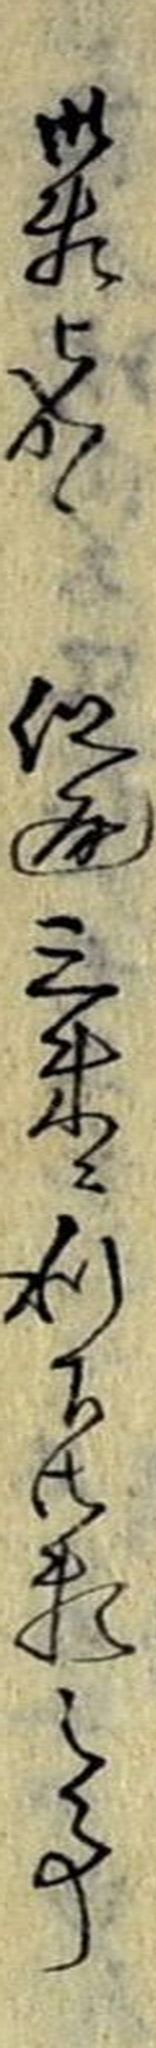御頼被成候但通三朱に利下御頼之事
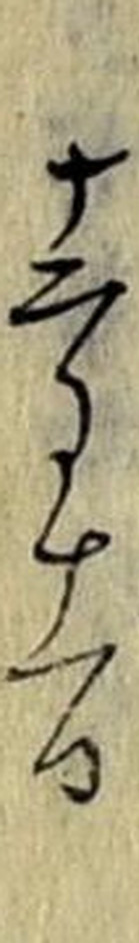十二月十一日
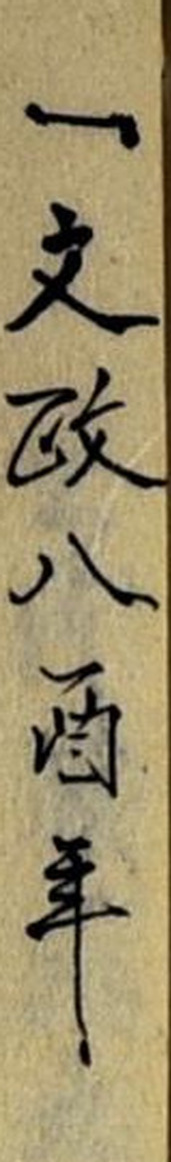一文政八酉年
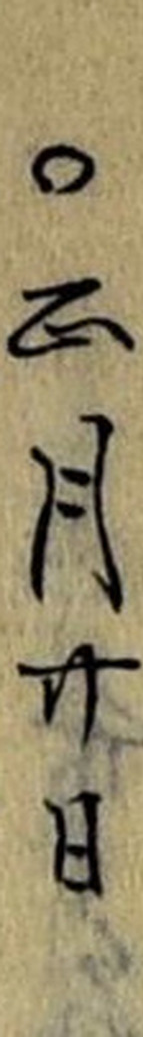○正月廿日
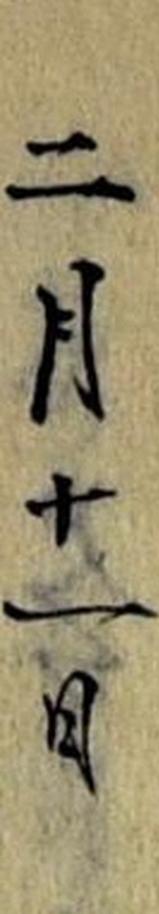二月十一日
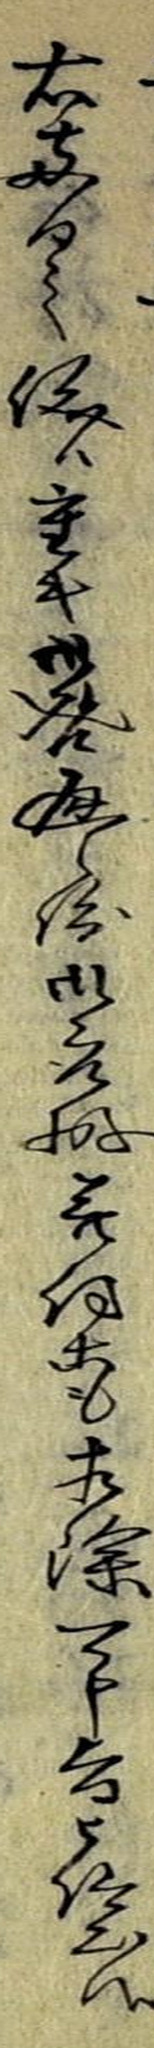右両日之儀は重キ御咎通之儀御取扱并伺等も相除可申旨被仰出候
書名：命令之部 四
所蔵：福井県文書館 Fukui Prefectural Archives
